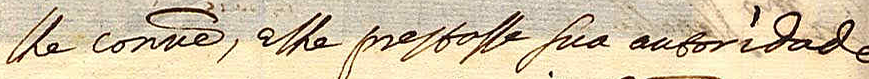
lhe conūe, E lhe prestasse sua autoridade
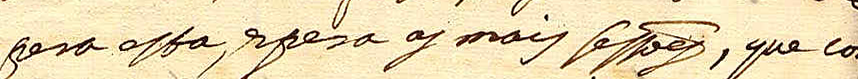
pera esta, E pera as mais sessões, que co
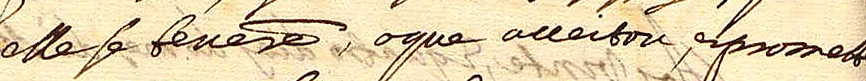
elle se teuer̄e, o que acceitou, E promett
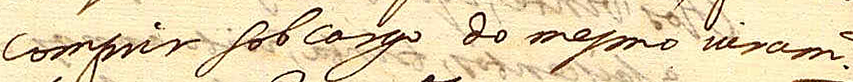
comprir sob cargo do mesmo iuram.t
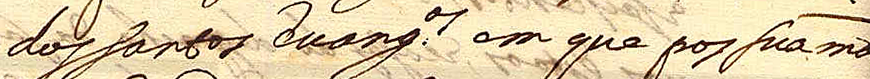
dos santos Euang.os em que pos sua mã
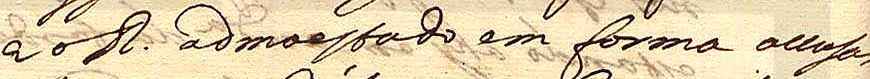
E o R. admoestado em forma accusan
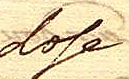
dose
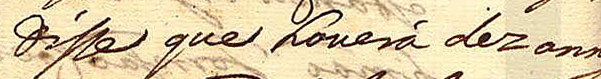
Disse que hauerá dez ann
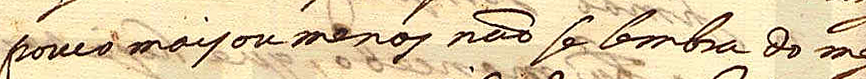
pouco mais ou menos não se lembra do mes
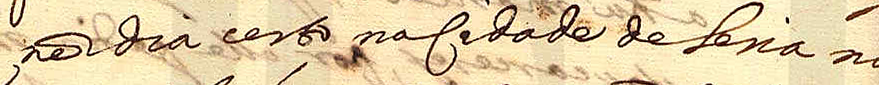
nē dia certo na Cidade de Leria no
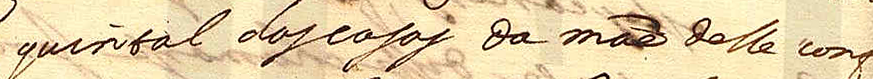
quintal das casas da mãe delle confi
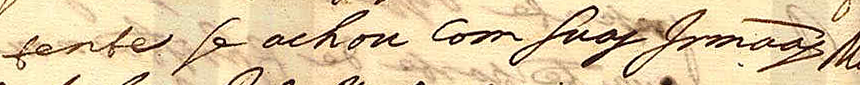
tente se achou com suas Jrmāas Ma
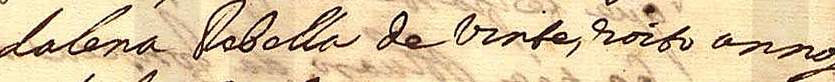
dalena Rebella de vinte, E oito annos
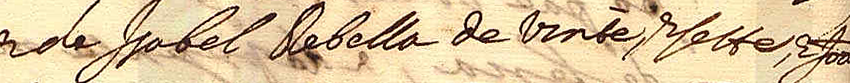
E de Jsabel Rebella de vinte, E sette, E Jōa
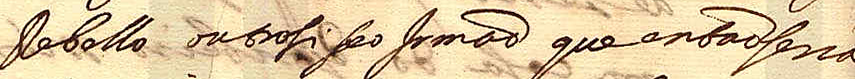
Rebello outrosi seo Jrmão que então seria
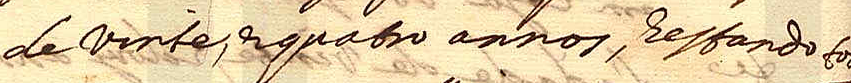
de vinte, E quatro annos, E estando tod
